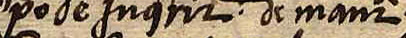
pode Jnqirir. de manra.
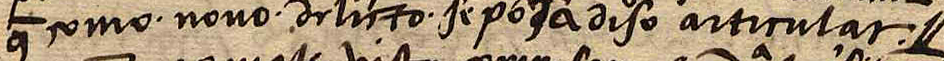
q̄ como . nouo. delicto. se posa diso articular.//.
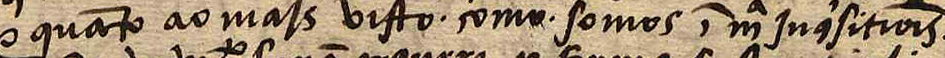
e quāto ao majs visto. como. somos ī ma Jnqisitiōis.
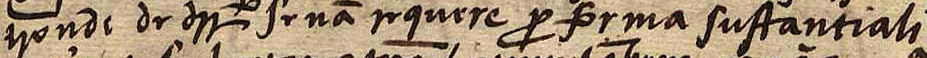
honde de drrto se nā requere ꝓ forma sustantiali.
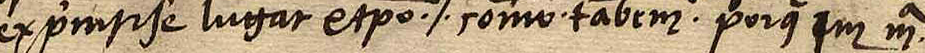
expimjrse lugar e tp̄o./. como. tābem. porq̄ jm ma:
